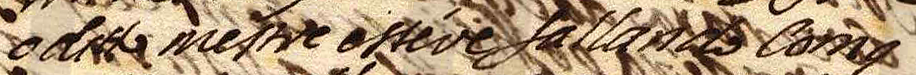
o ditto mestre esteve falando com o
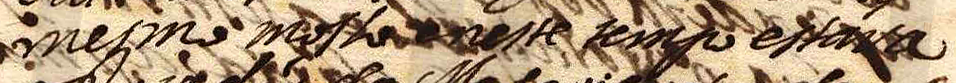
mesmo mosso neste tempo estava
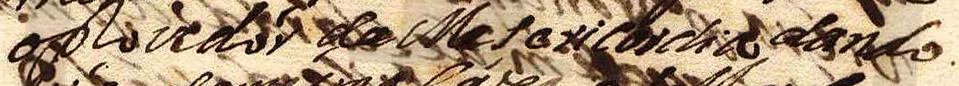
o provedor da Mesericordia dando
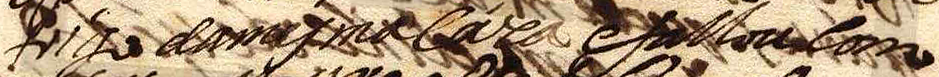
trigo da mesma Cáza e fallou com
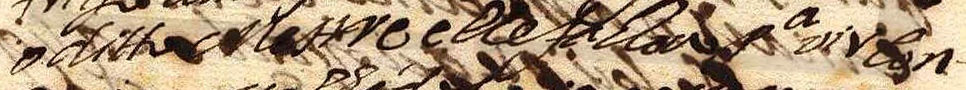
o ditto Mestre elle fallou pa vir con
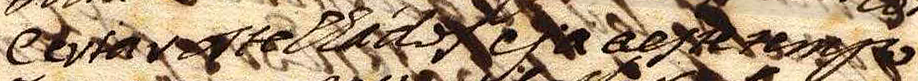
certar os telhados e ja a este tempo
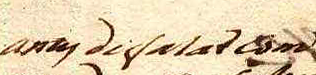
antes de falar com
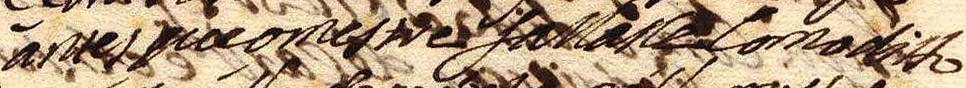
antes que o mestre fallasse Com o ditto
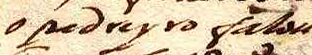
o pedreyro falou
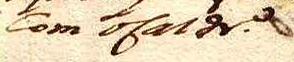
com o Caldr.o
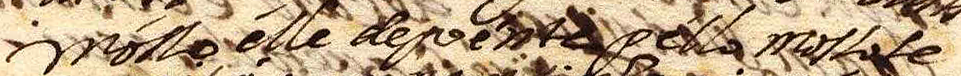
mosso elle depoente pello mosso se
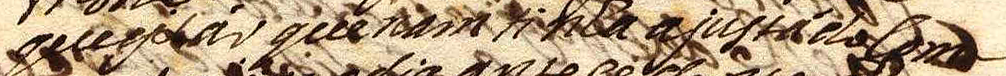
queyxar que nam tinha ajustado Com
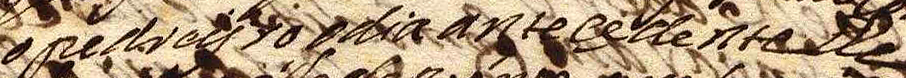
o pedreyro o dia antecedente lhe
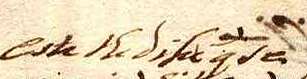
este lhe disse q̄ se
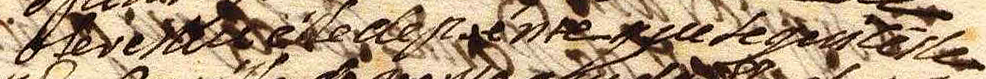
oferesseu elle depoente que se quizesse
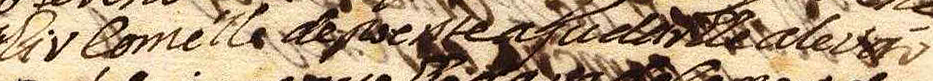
hir com elle depoente ajudarlhe a levar
